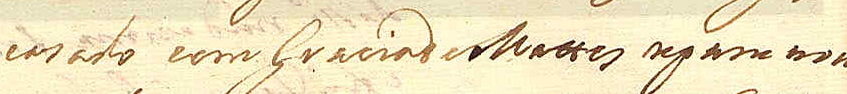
casado com Gracia de Mattos xpam nou
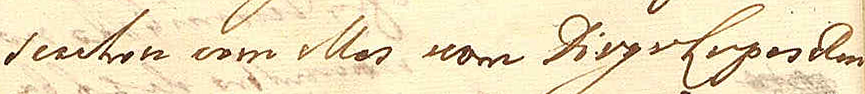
se achou com elles e com Diogo Lopes Ren
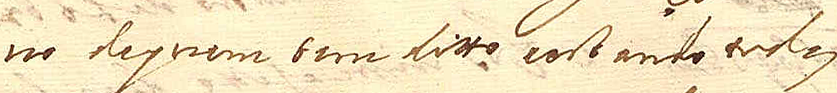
no de quem tem ditto e estando todos
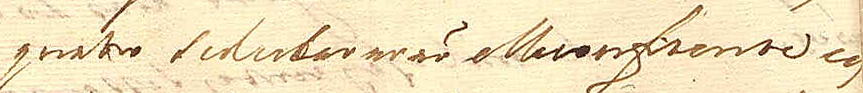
quatro se declararaõ elle confitente e os
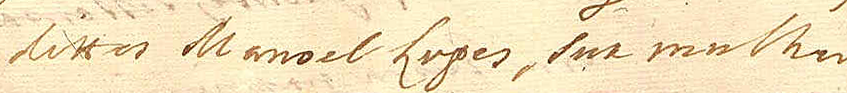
dittos Manoel Lopes, sua mulher
